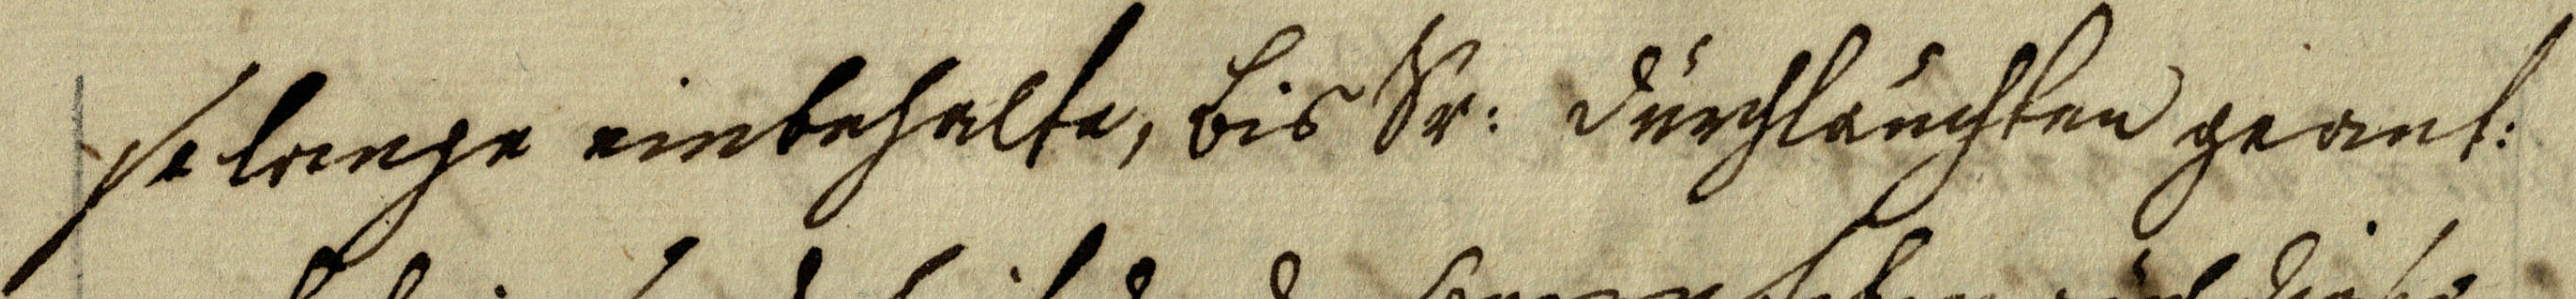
solange einbehalte, bis Sr. Durchlauchten geant¬
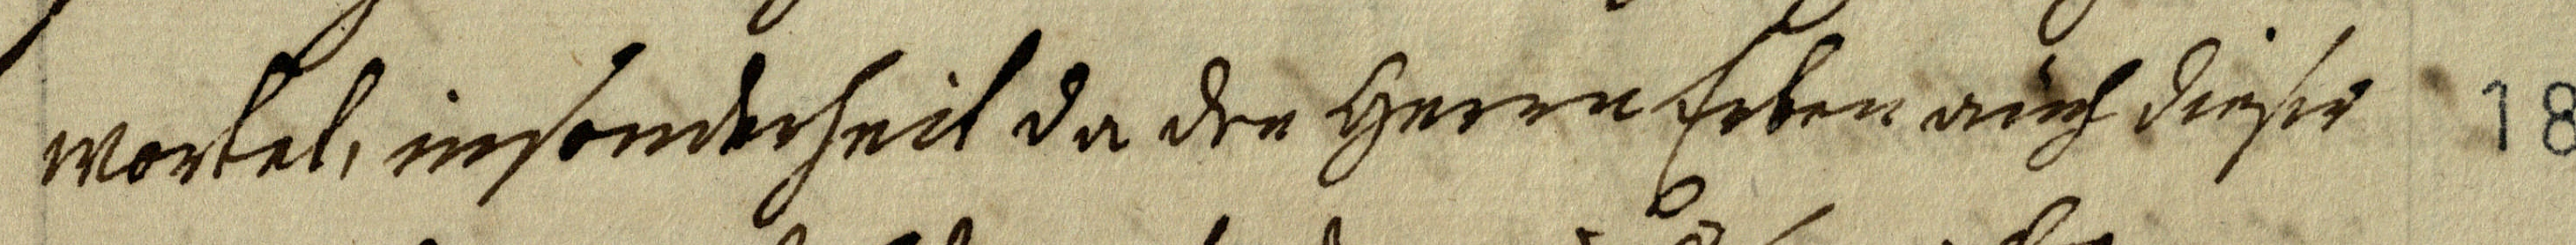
wortet, insonderheit da den Herrn Erben auch dieser
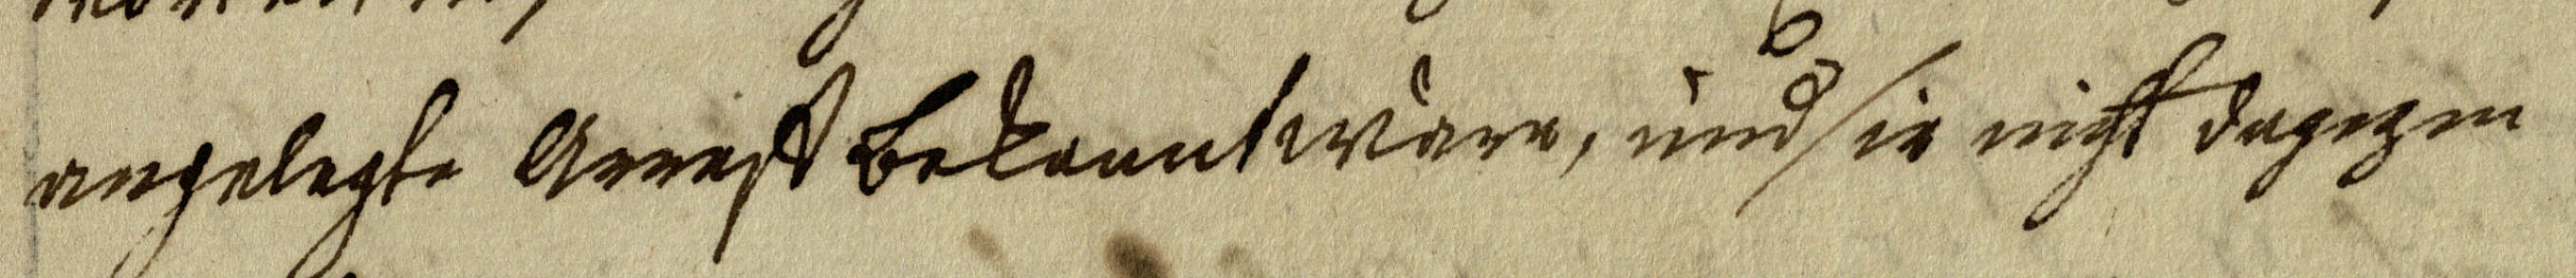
angelegte Arrest bekannt wäre, und sie nicht dagegen
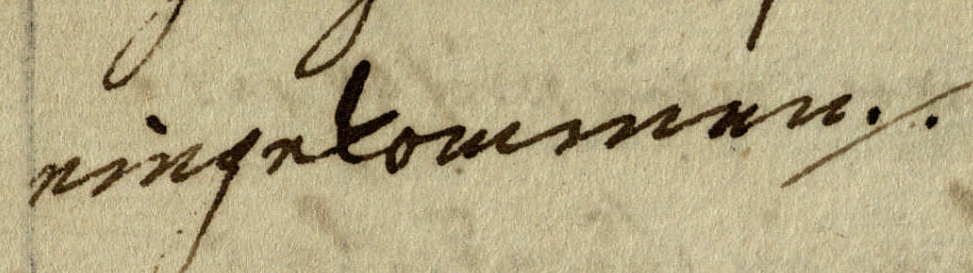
eingekommen.
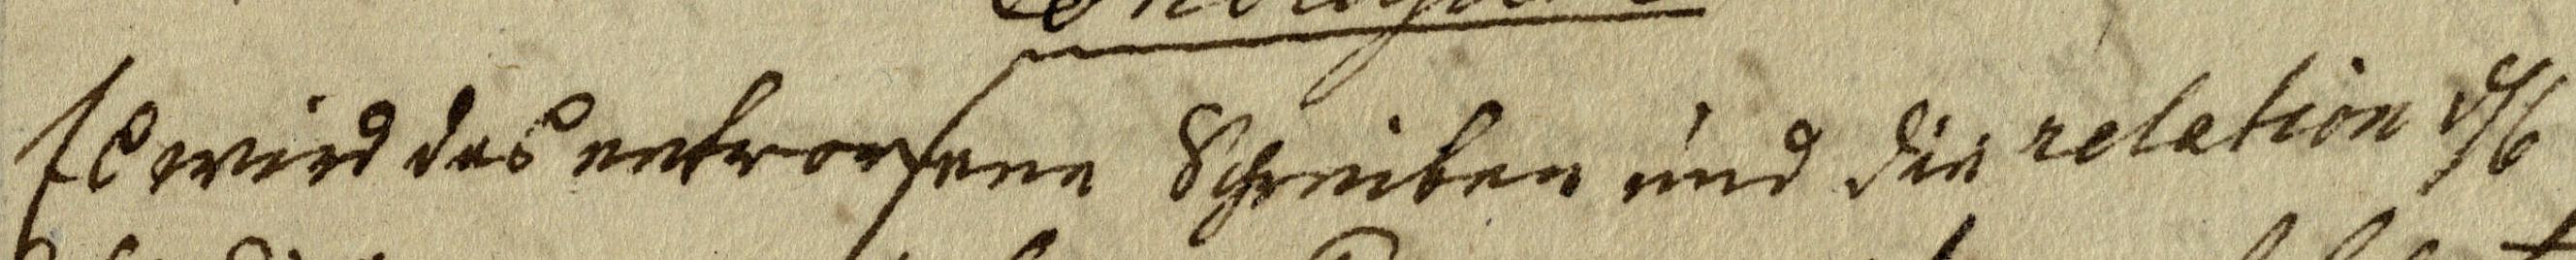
Es wird das entworfene Schreiben und die relation dh
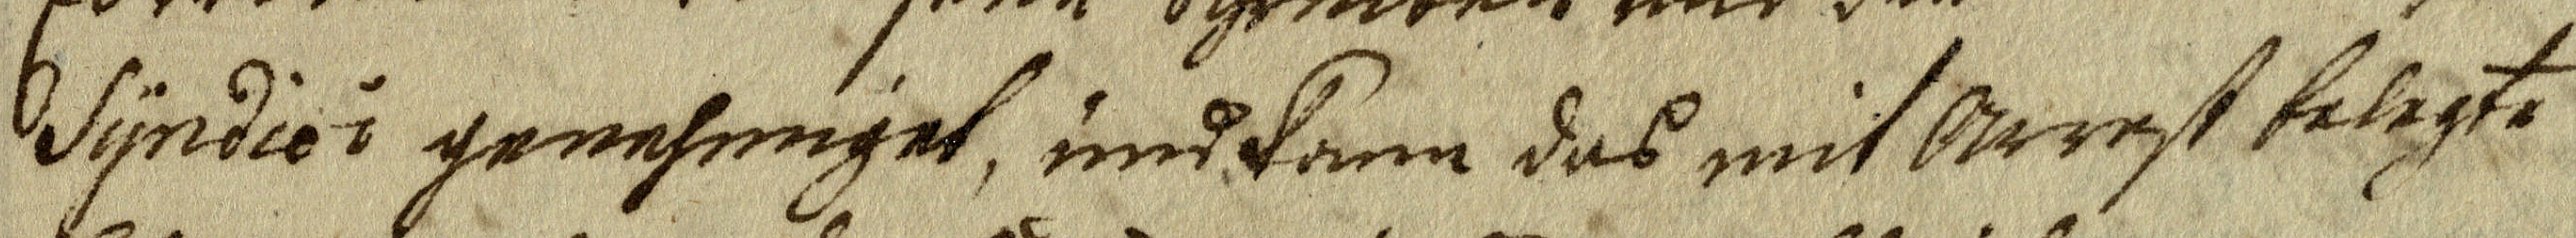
Sÿndici genehmiget, und kann das mit Arrest belegte
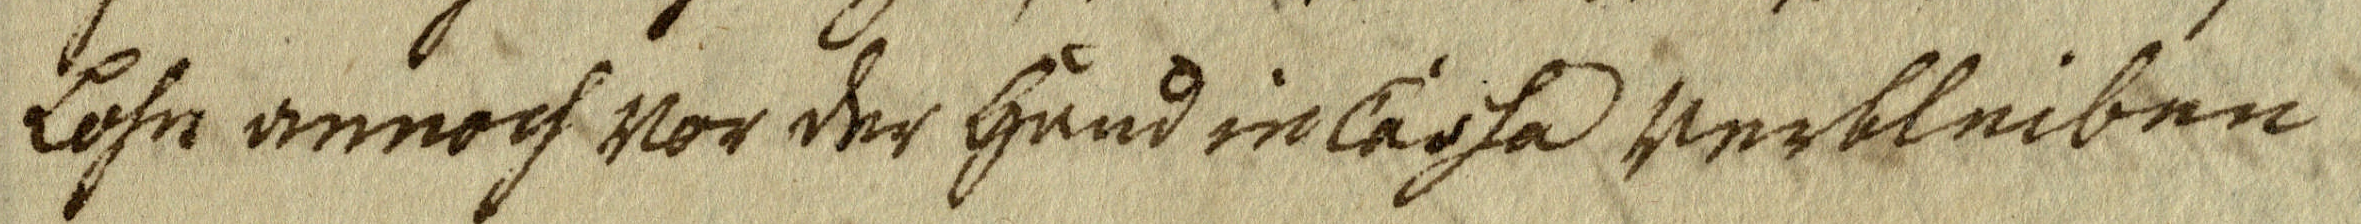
Lohn annoch vor der Hand in Cassa verbleiben.
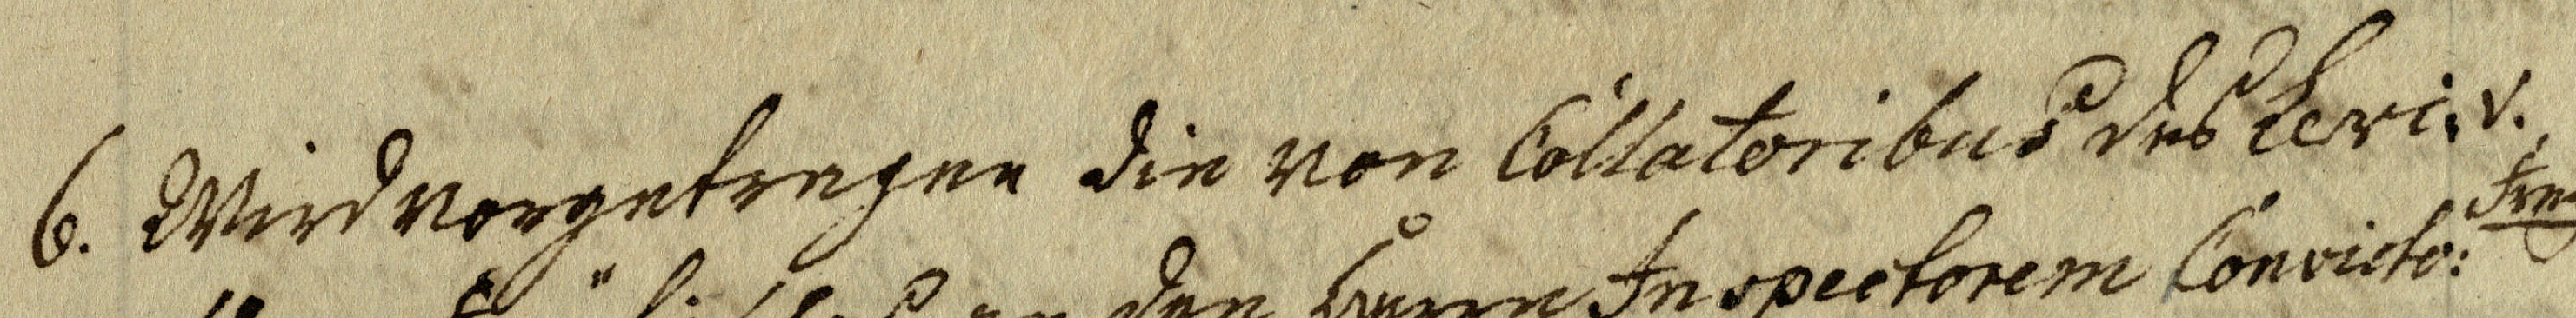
6. Wird vorgetragen die von Collatoribus des Levi¬
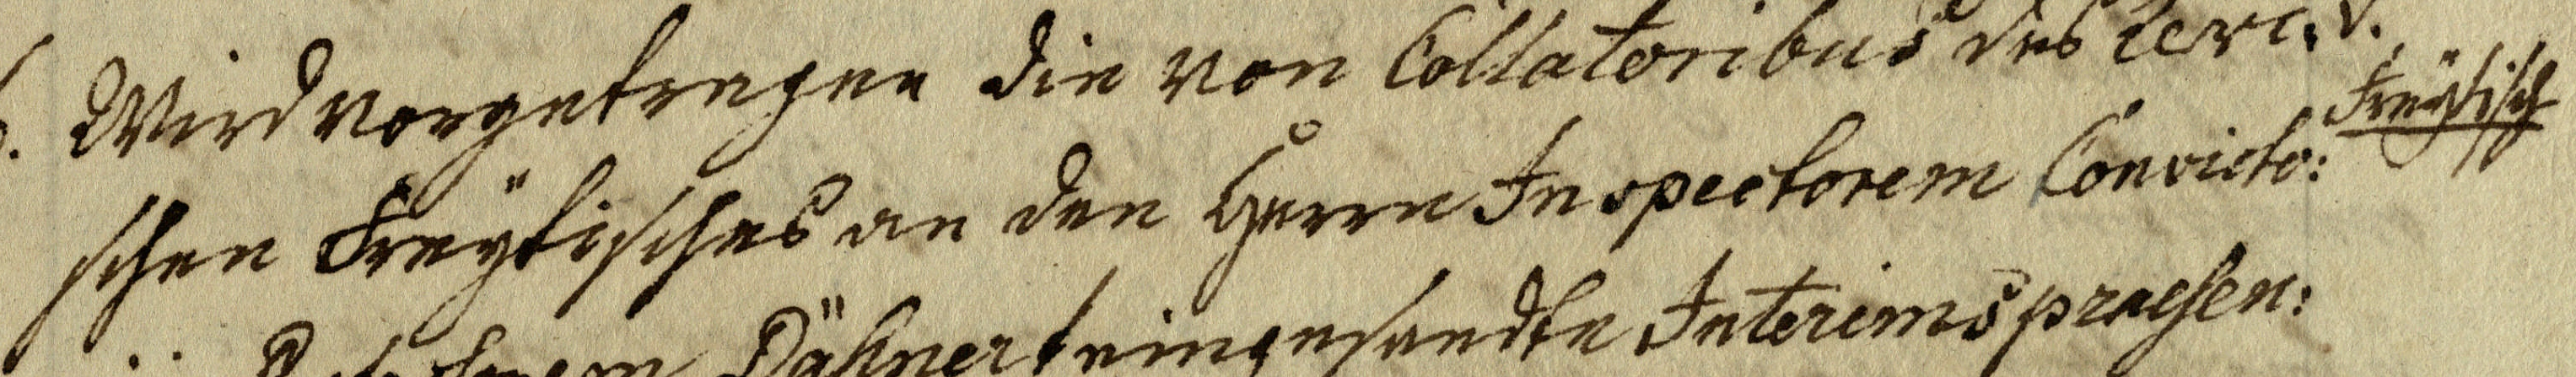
schen Freÿtisches an den Herrn Inspectorem Convicto¬ Freÿtisch
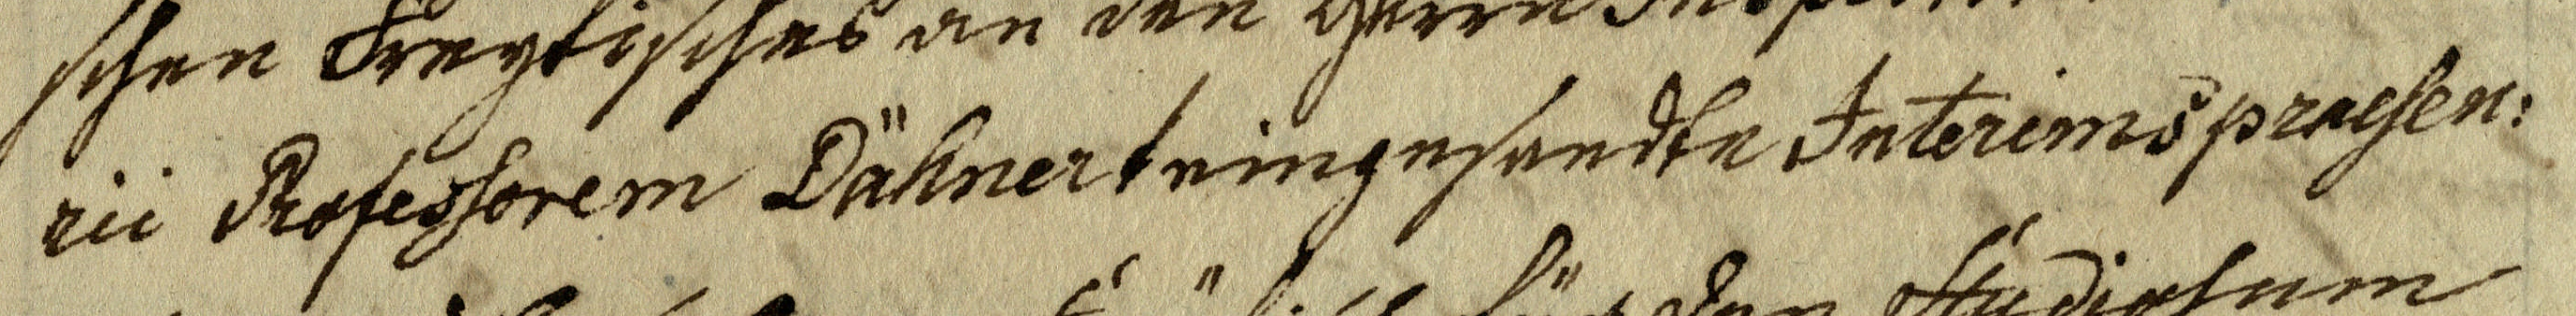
rii Professorem Dähnert eingesandte Interimspraesen¬
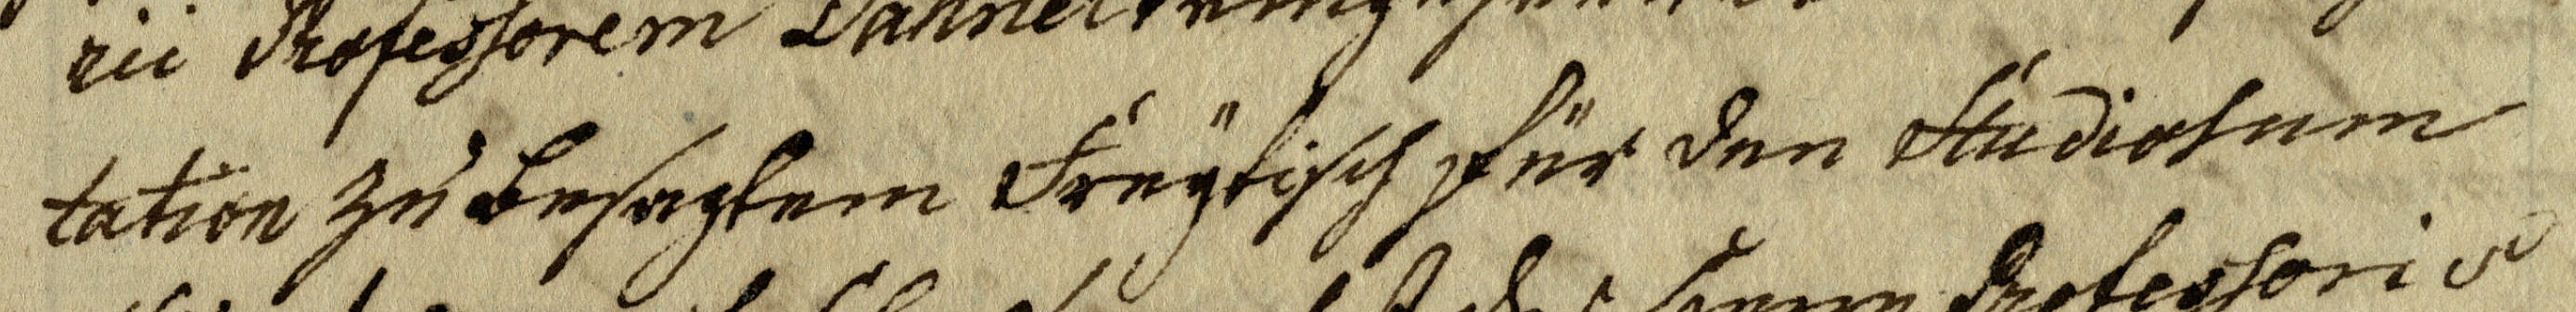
tation zu besagtem Freÿtisch für den Studiosum
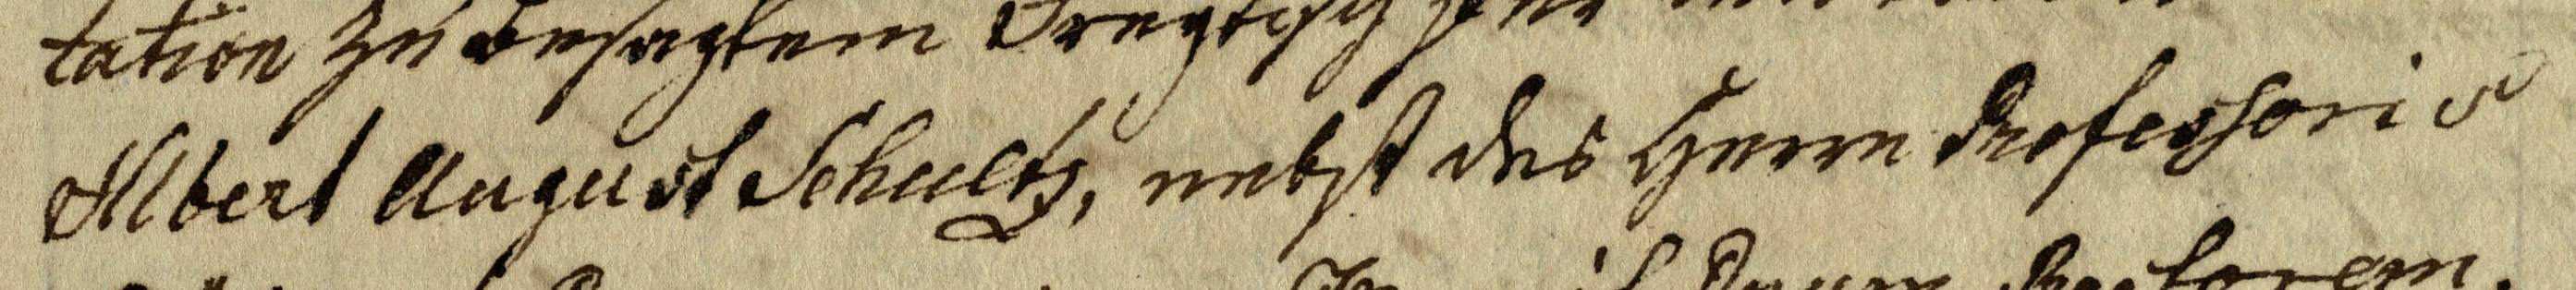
Albert August Schultz, nebst des Herrn Professoris
